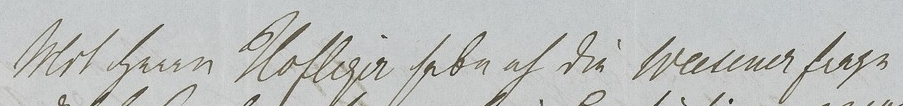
Mit Herrn Höfliger habe ich die Weesener Frage
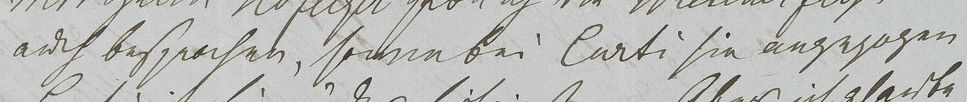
auch besprochen, sowie bei Curti sie angezogen.
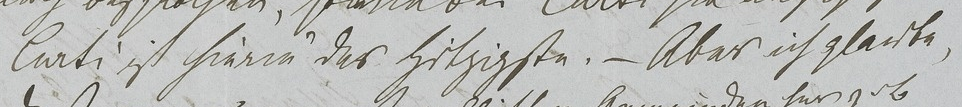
Curti ist hierin der Hitzigste. – Aber ich glaube,
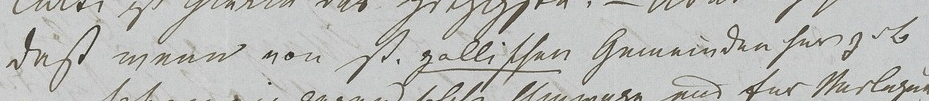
daß wenn von st.gallischen Gemeinden her z. B.
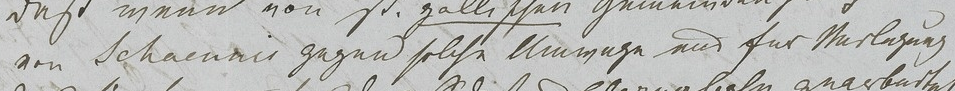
von Schaenis gegen solche Umwege und für Verlegung
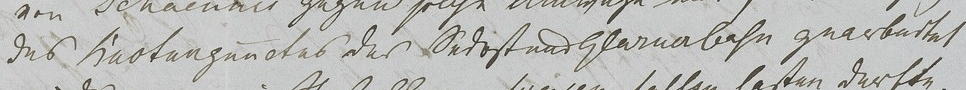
des Knotenpunctes der Südost und Glarner bahn gearbeitet
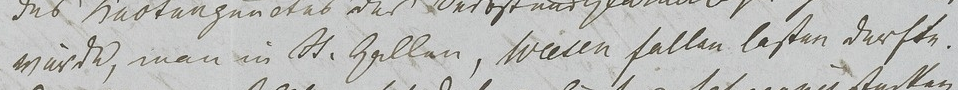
würde, man in St. Gallen, Weesen fallen laßen dürfte.
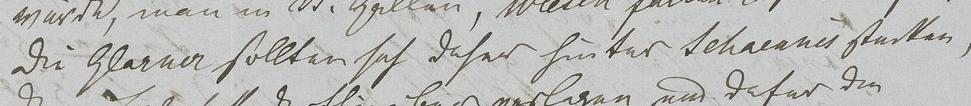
Die Glarner sollten sich daher hinter Schaenis stecken,
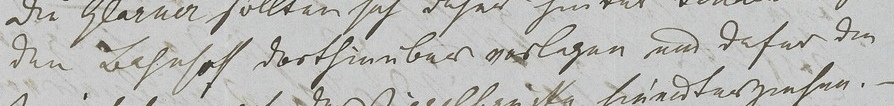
den Bahnhof dorthinüber verlegen und dafür die
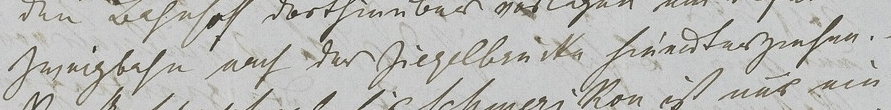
Zweigbahn nach der Ziegelbrücke hinunterziehen. –
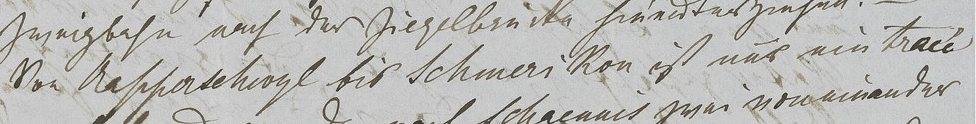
Von Rapperschwyl bis Schmerikon ist nur ein tracé
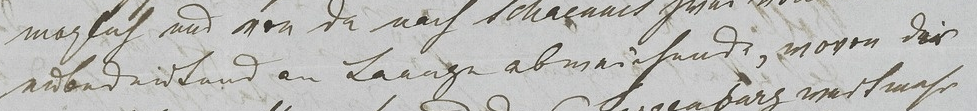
unbedeutend an Laenge abweichende, wovon die
